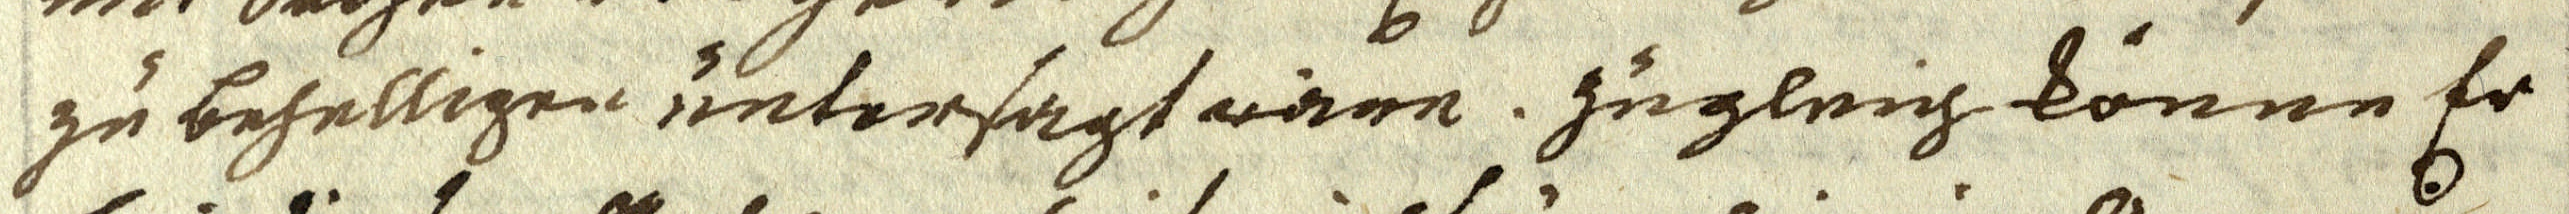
zu behelligen untersagt wäre. Zugleich könne Er
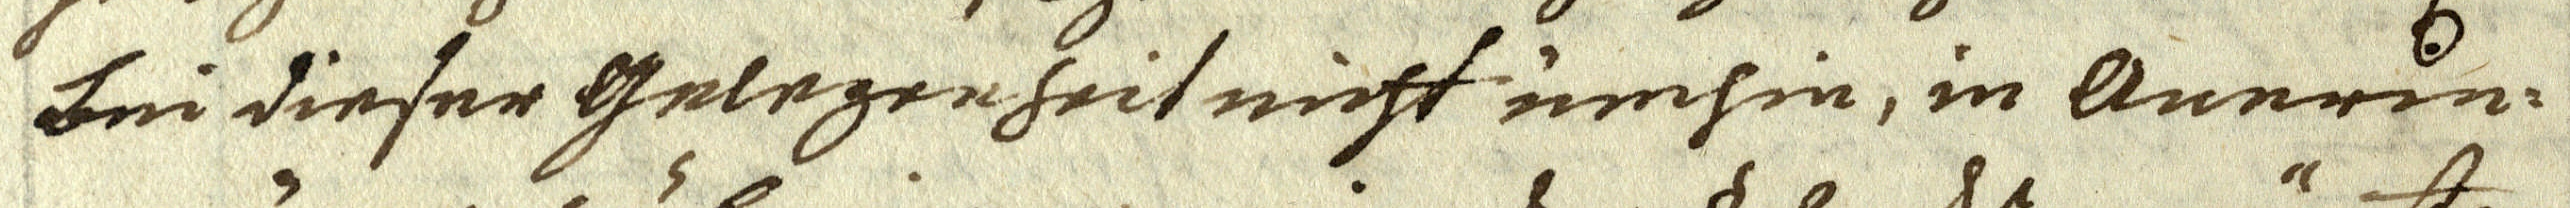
bei dieser Gelegenheit nicht umhin, in Anerin¬
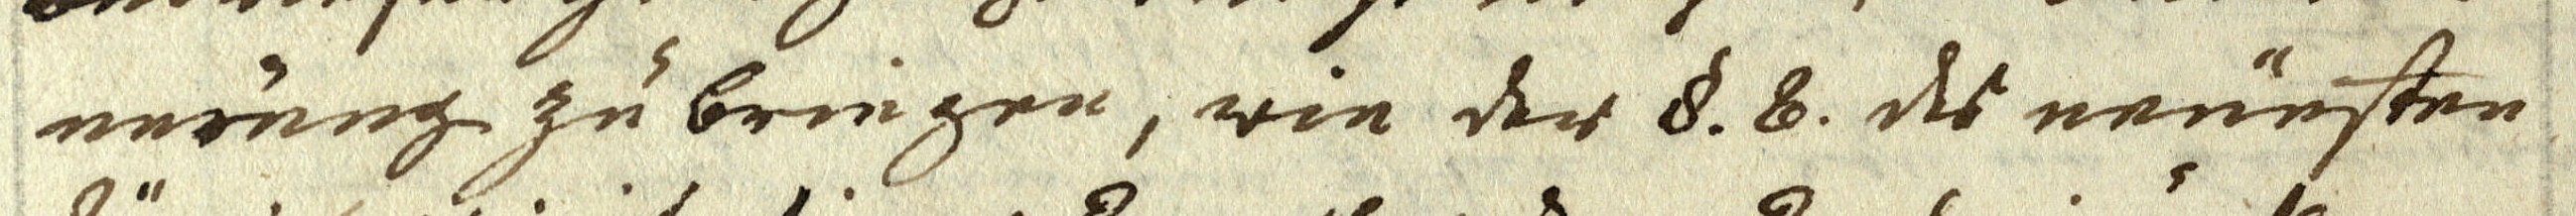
nerung zu bringen, in der §. 8. des neuesten
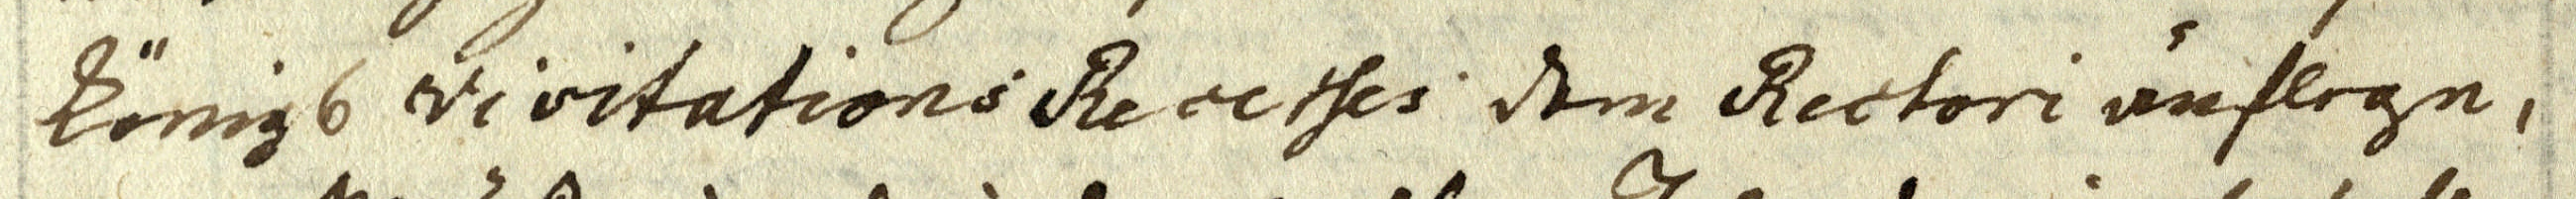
Königl Visitations Recesses dem Rectori auflege,
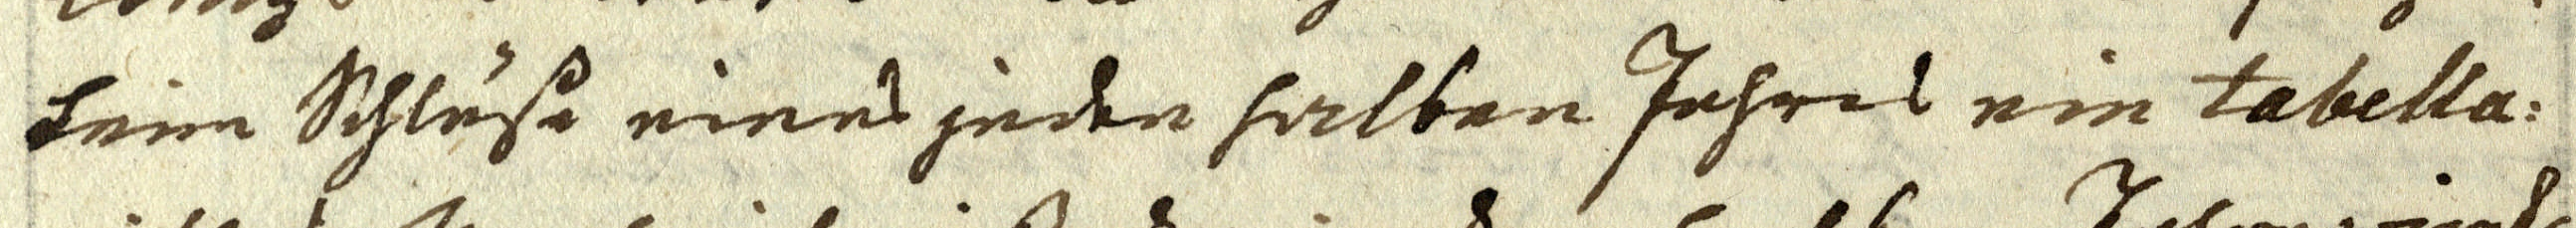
beim Schluße eines jeden halben Jahres ein tabella¬
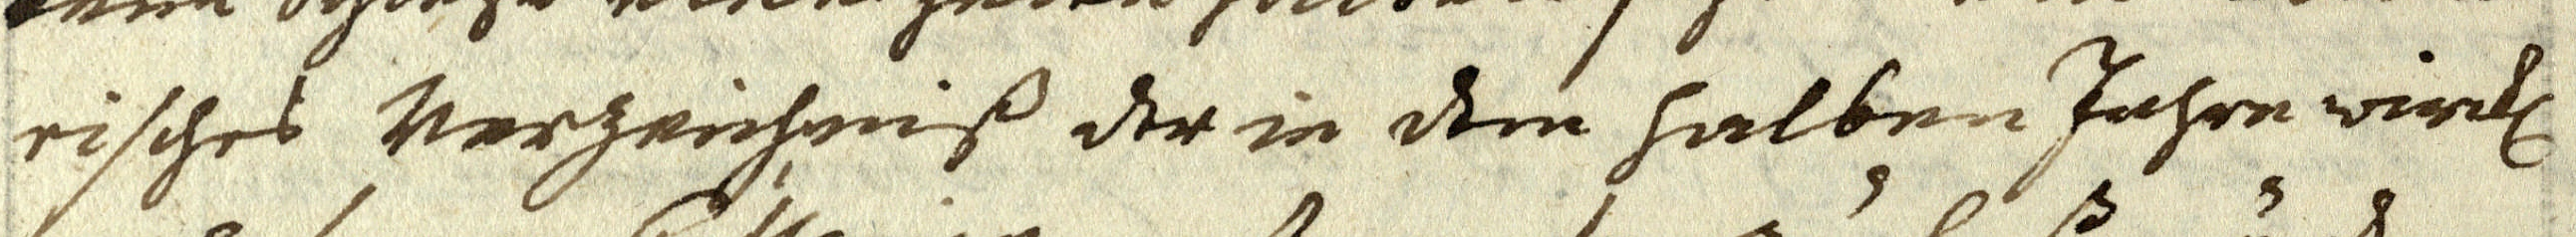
risches Verzeichniß der in dem halben Jahre wirckl.
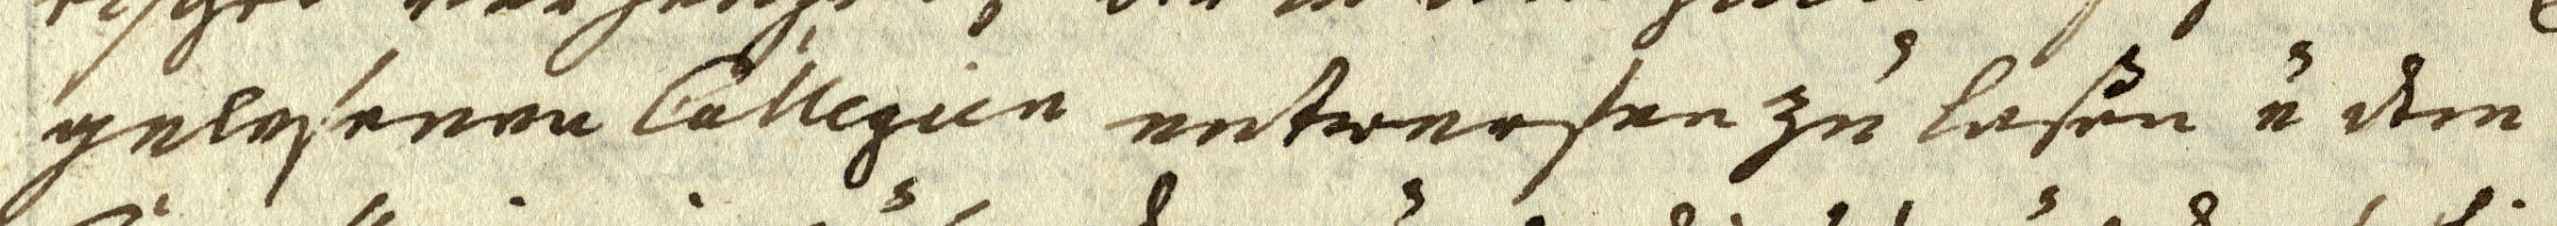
gelesenen Collegien entwerfen zur laßen u dem
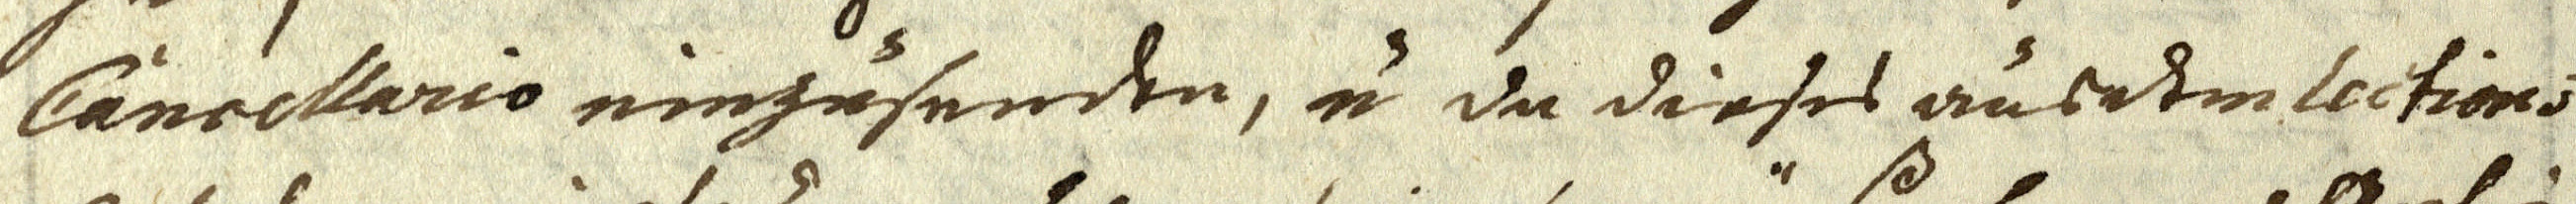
Cancellario einzusenden, u da dieses aus dem lections¬
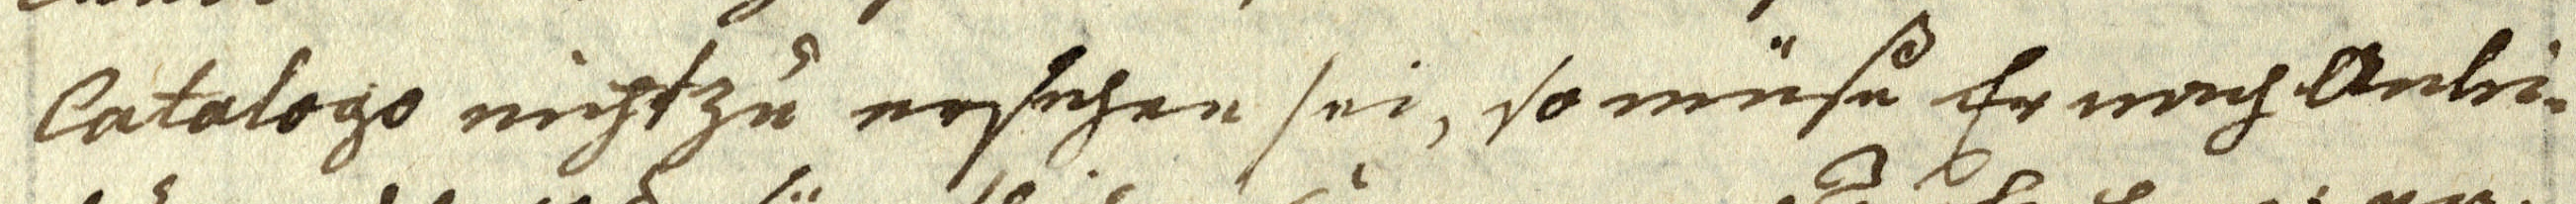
Catalogo nhtze ersehen sei, so müße Er nach Anlei¬
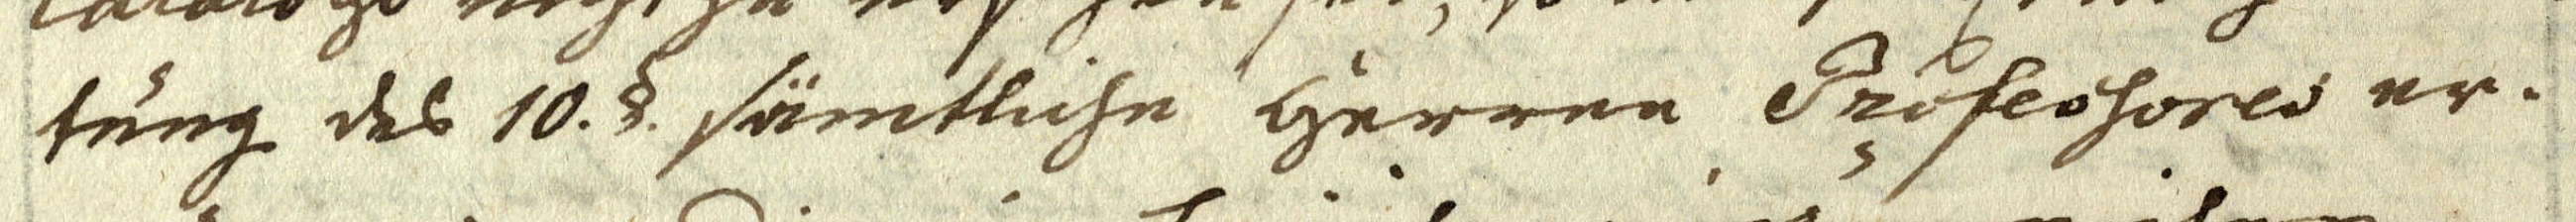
tung das 10. §. sämtliche Herren Professores er¬
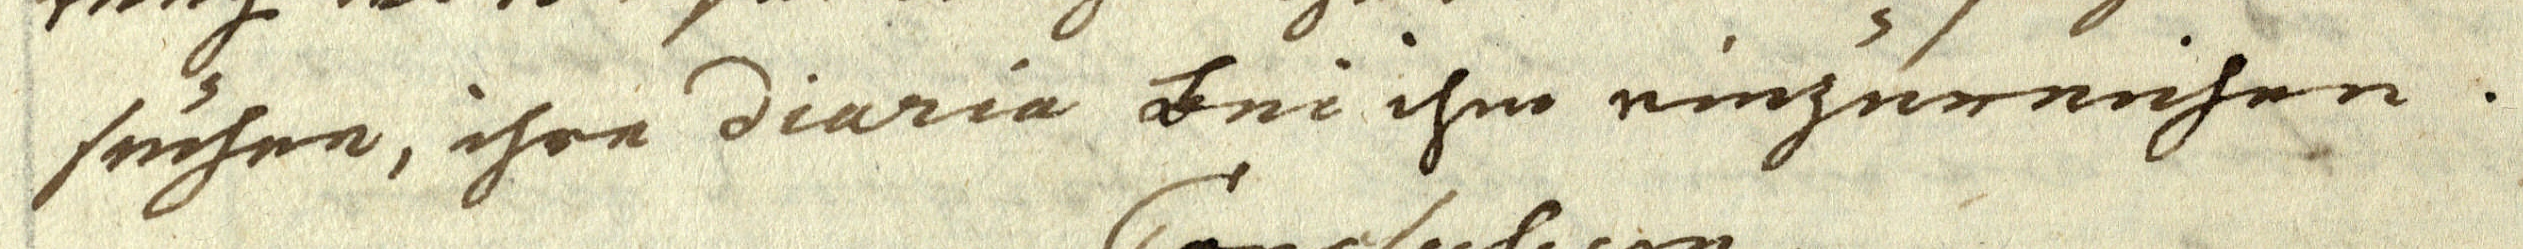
suchen, ihre diaria bei ihm einzureichen.
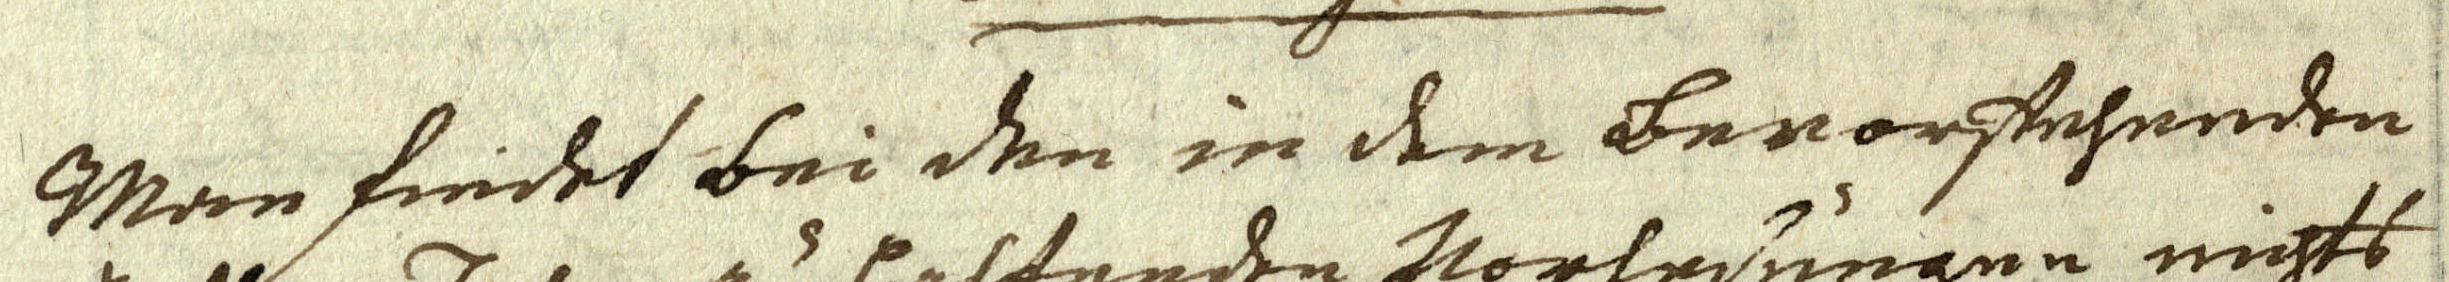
Man findet bei den in dem bevorstehenden
